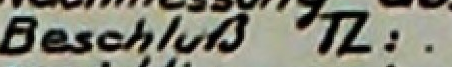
Beschluß TL: ..........
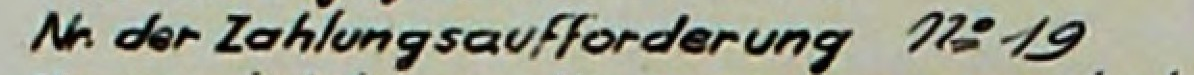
Nr. der Zahlungsaufforderung Nr 19
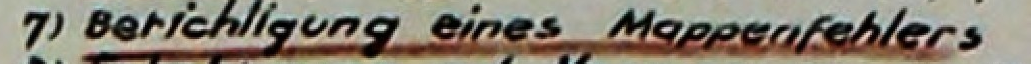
7) Berichtigung eines Mappenfehlers
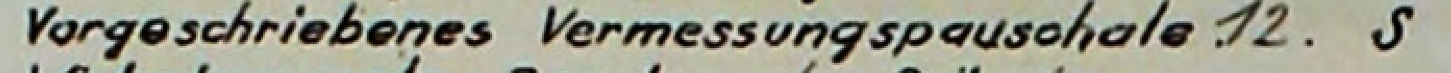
Vorgeschriebenes Vermessungspauschale 12. S
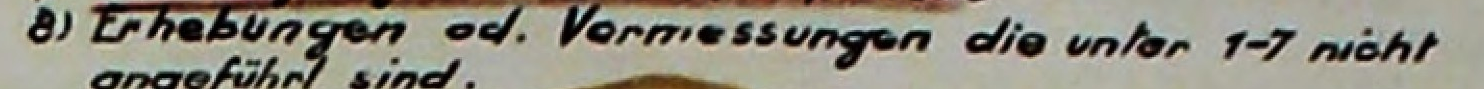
8) Erhebungen od. Vermessungen die unter 1-7 nicht
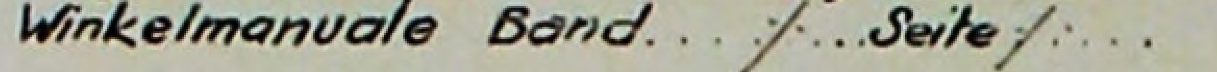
Winkelmanuale Band /Seite/
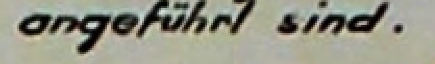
angeführt sind.
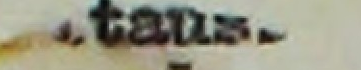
taus-
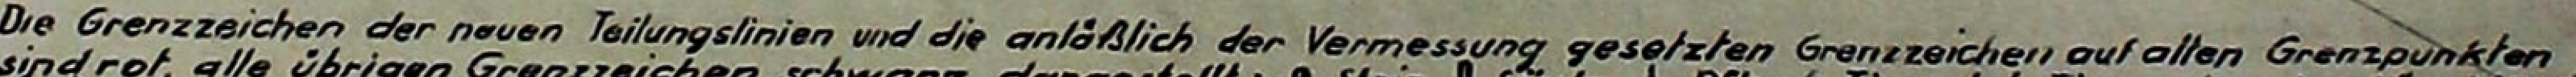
Die Grenzzeichen der neuen Teilungslinien und die anläßlich der Vermessung gesetzten Grenzzeichen auf allen Grenzpunkten
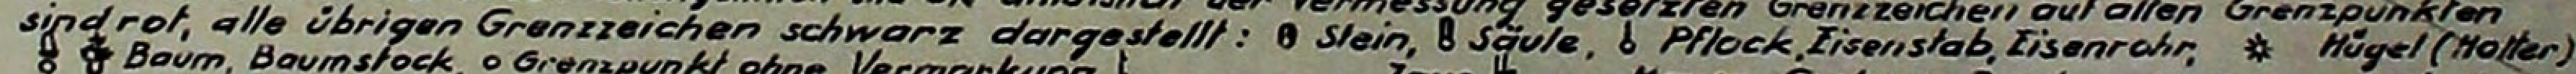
sind rot, alle übrigen Grenzzeichen schwarz dargestellt: ? Stein, ? Säule, ? Pflack, Eisenstab, Eisenrohr, ? Hügel (Halter)
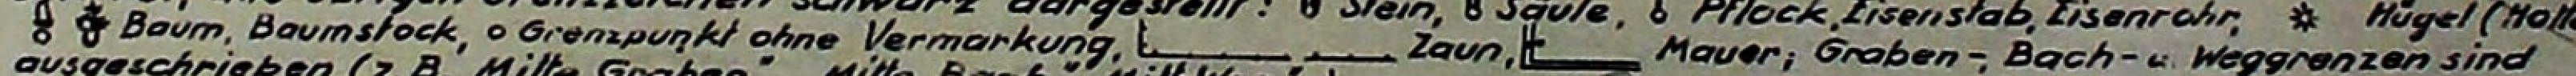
?? Baum, Baumstock, ? Grenzpunkt ohne Vermarkung, Zaun, Mauer; Graben-, Bach- u. Weggrenzen sind
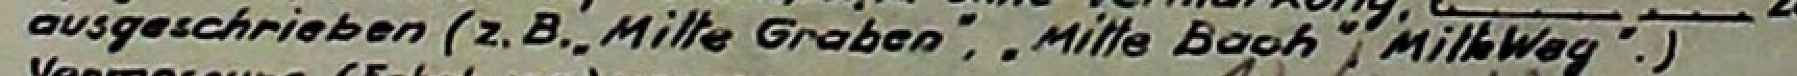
ausgeschrieben (z.B. „Mitte Graben", „Mitte Bach", Mille Weg".)
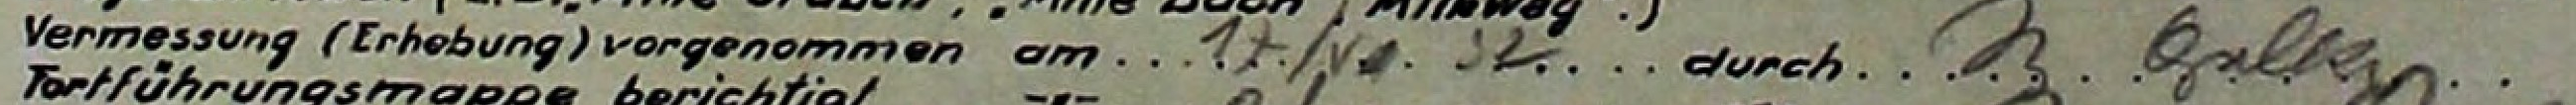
Vermessung (Erhebung) vorgenommen am 17/V? 32 durch S Gel???
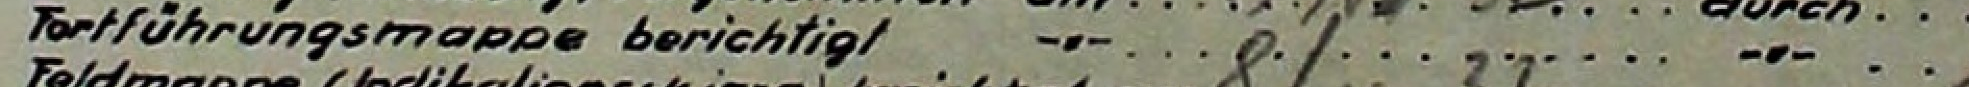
Tortführungsmappe berichtigt -„- -„-
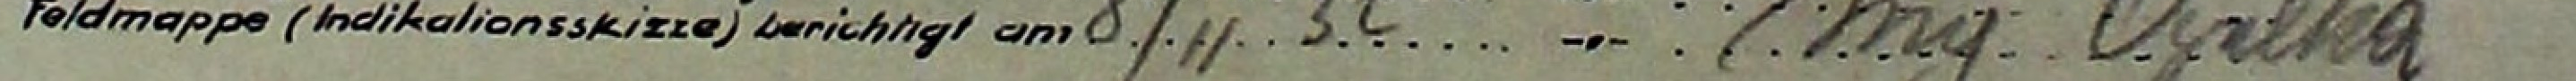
Feldmappe (Indikationsskizze) berichtigt am 8/11 32 -„- my Ogelka
